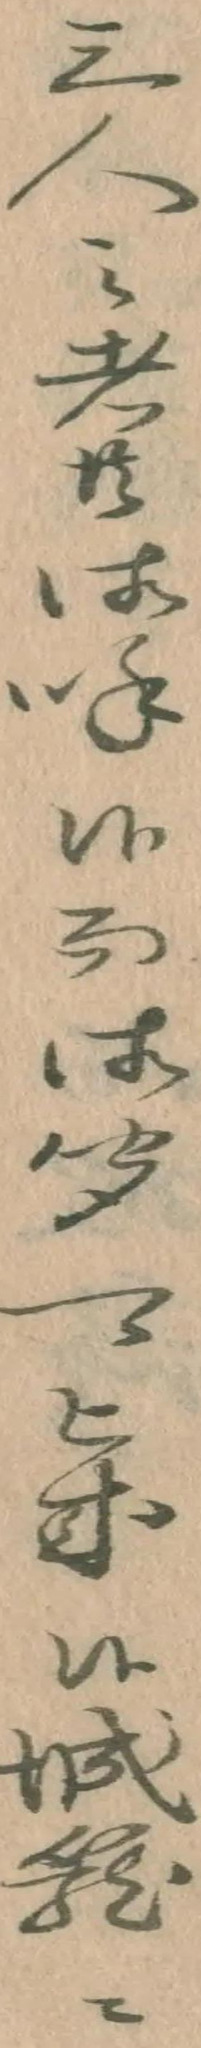三人之者共御呼候而御聞可被成候城籠に
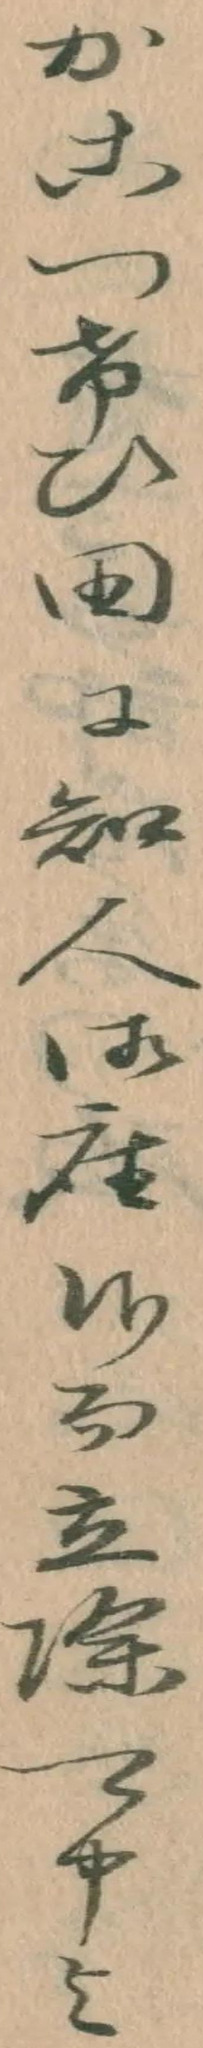か古つ希ひ由尓知人御座候而立除可申与
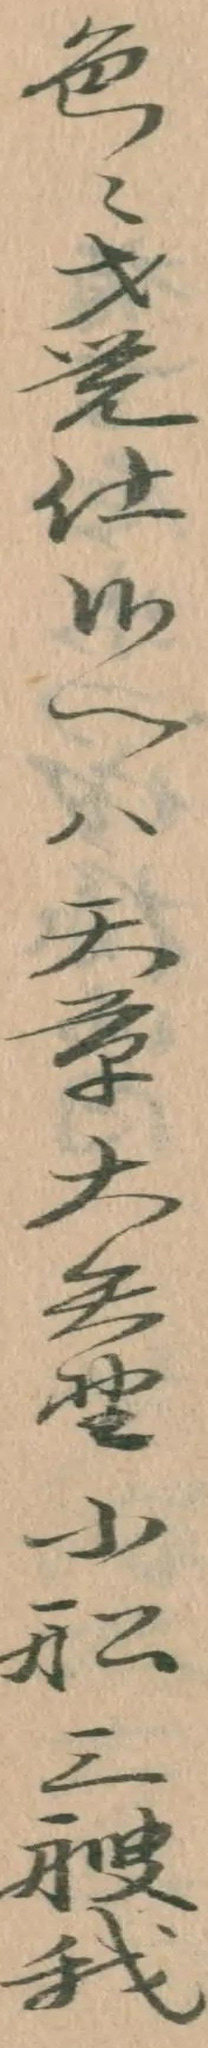色々才覚仕候へは天草大矢野小舩三艘我
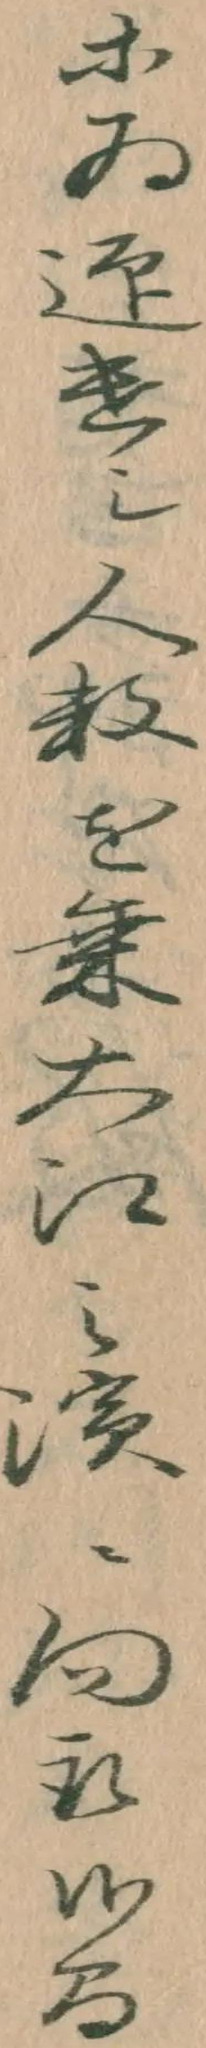等ゐ迎遣し人数を乗大江之浜に向取候間
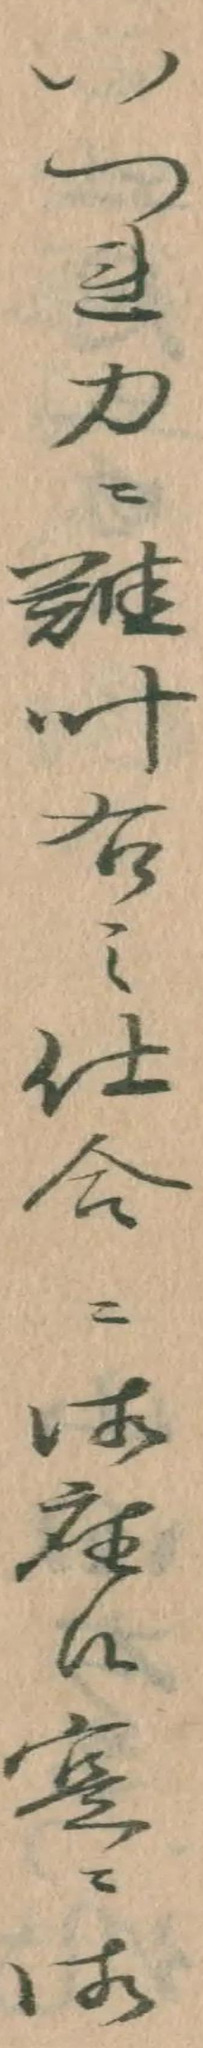いつ連力に難叶右之仕合に御座候寔に御
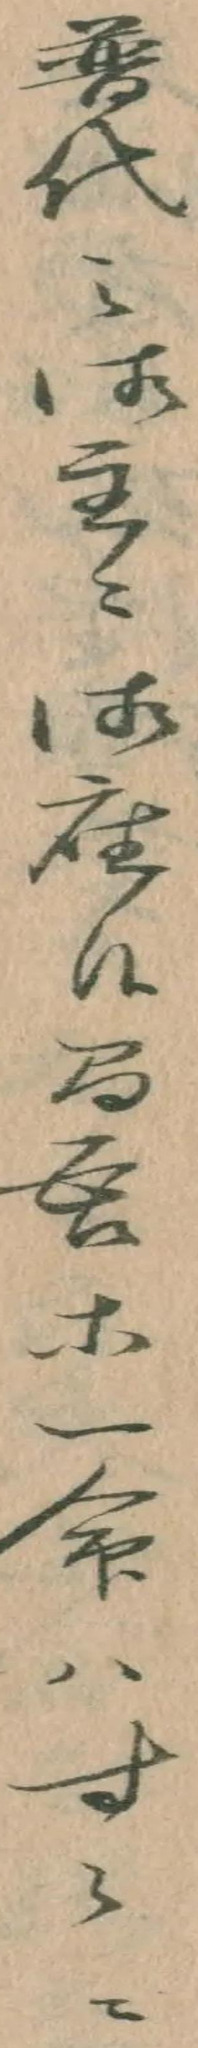普代之御主に御座候間吾等一命は寸々に
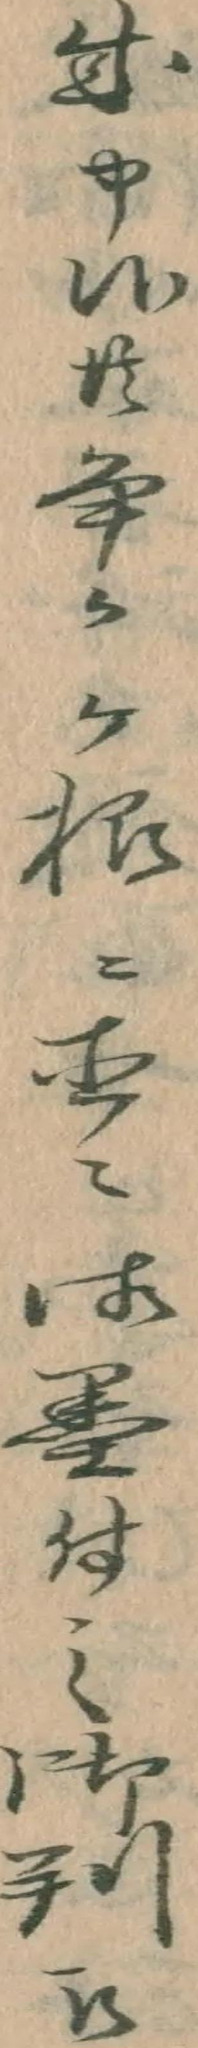成申候共争々け様に直に御墨付之御判被
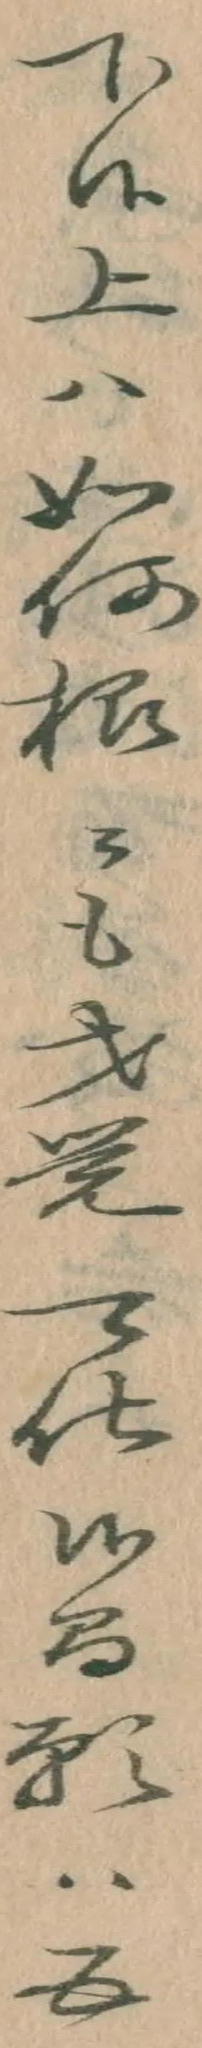下候上は如何様にも才覚可仕候間願は五
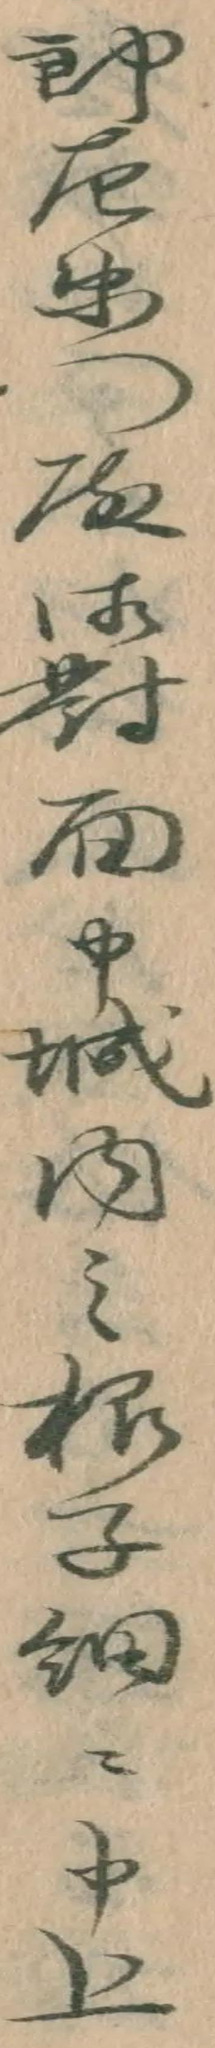郎左衛門殿御対面申城内之様子細に申上
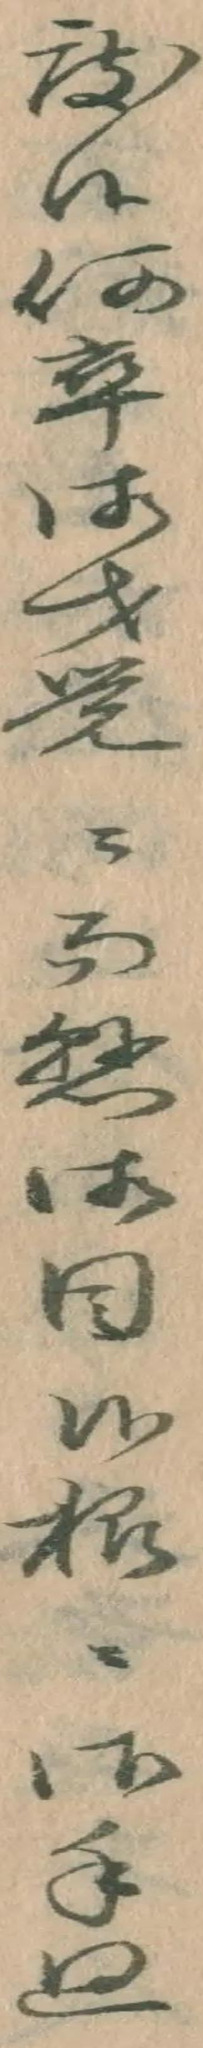度候何卒御才覚に而懸御目候様に御手廻
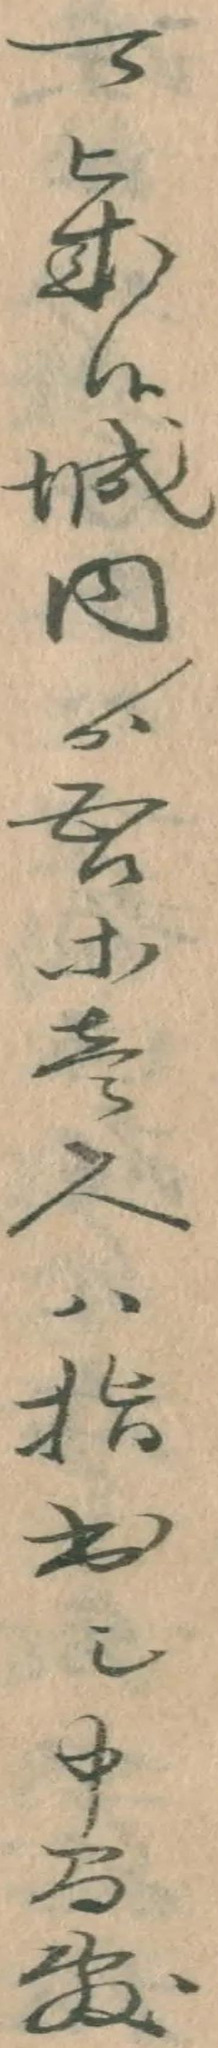可被成候城内ゟ吾等壱人は指出し申間敷
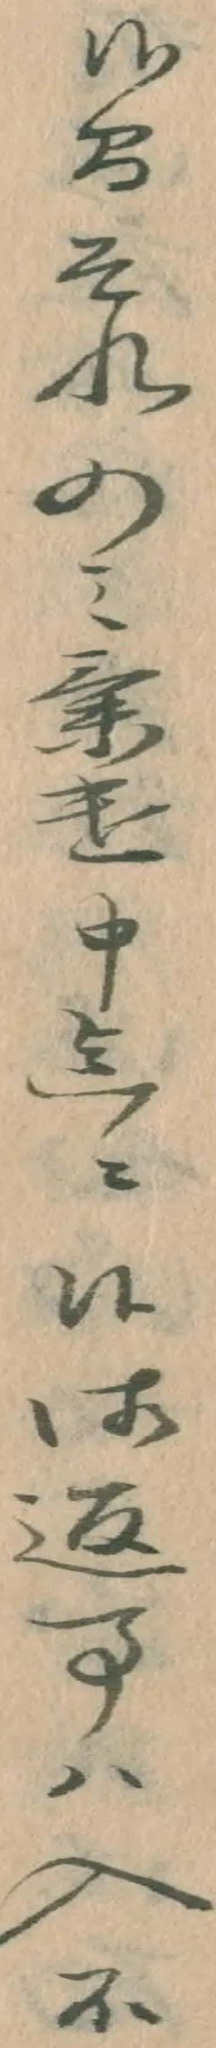候間それのみ氣遣申迄に候御返事は入不
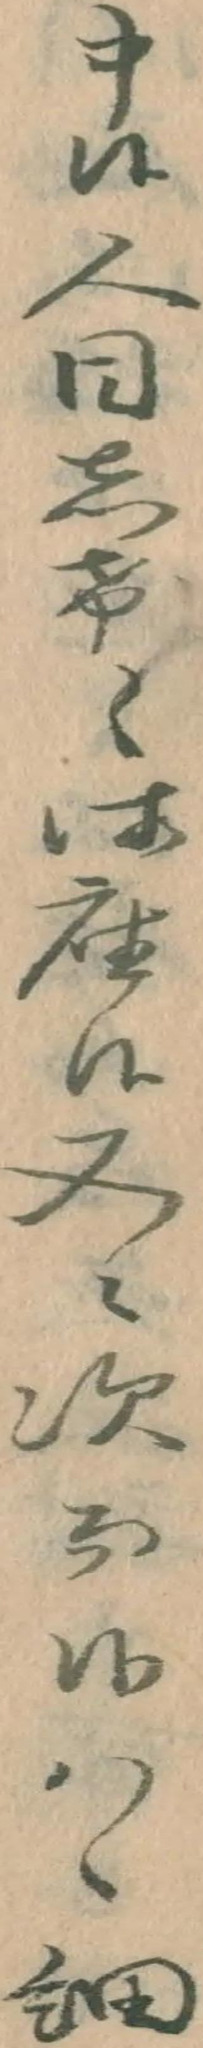申候人目志希〱御座候又々次而候はゝ細

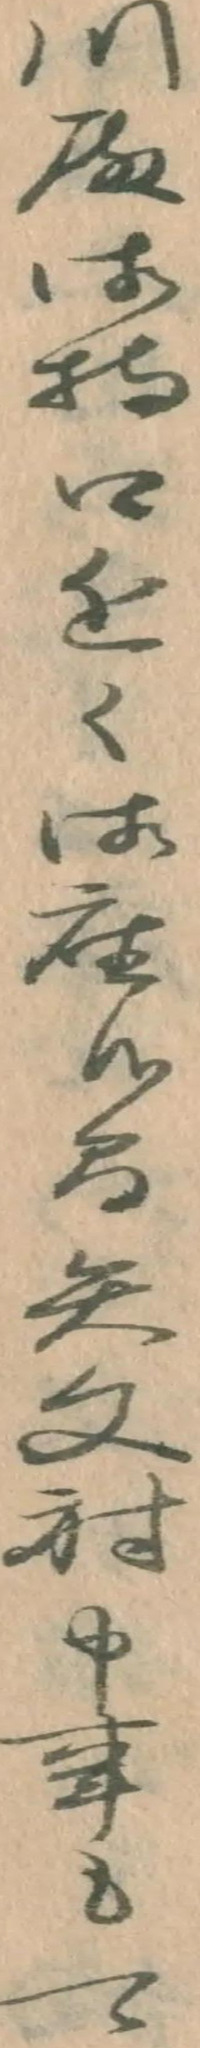川殿御持口近く御座候間矢文射申事も可
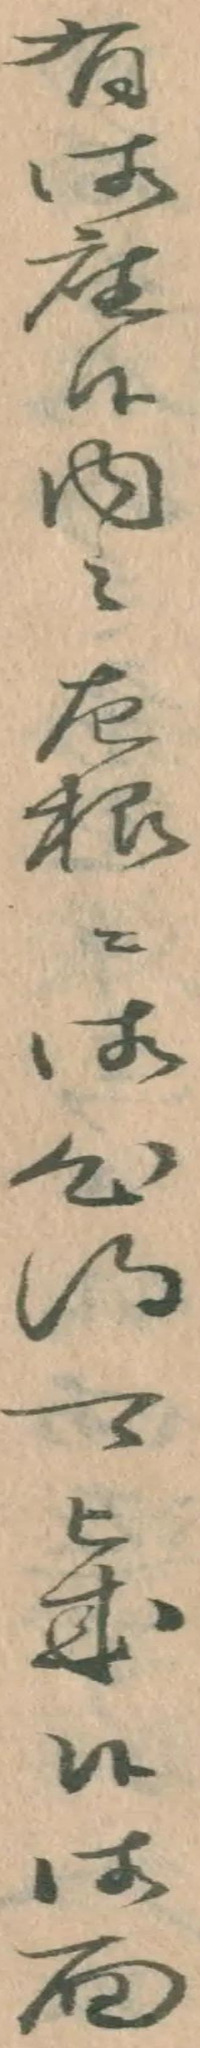有御座候内に左様に御心得可被成候御面
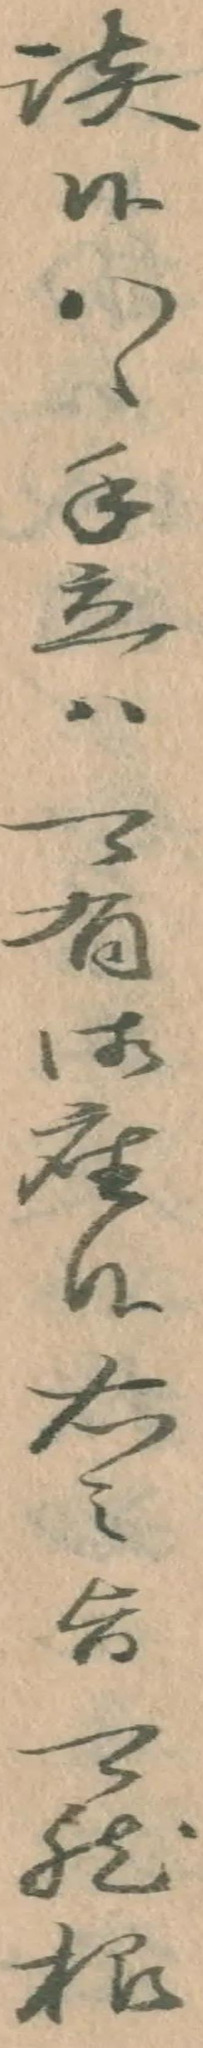談候はゝ手立は可有御座候右之旨可然様
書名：切支丹御退治記 49巻. [6]
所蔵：国立国会図書館 National Diet Library, JAPAN
